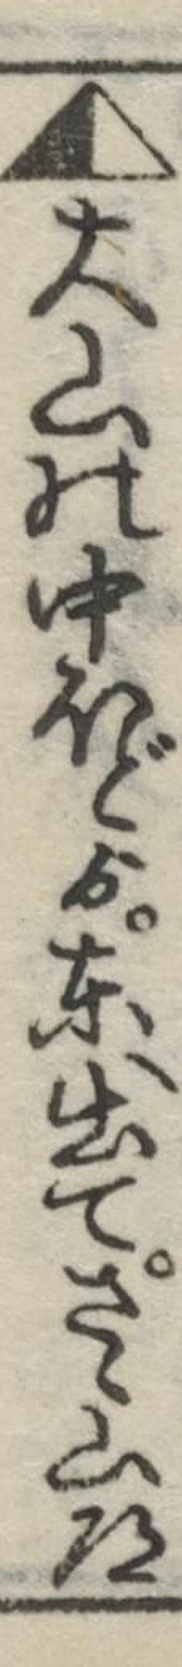▲大山の中ほどゟ。東へ出て。さゝ山道
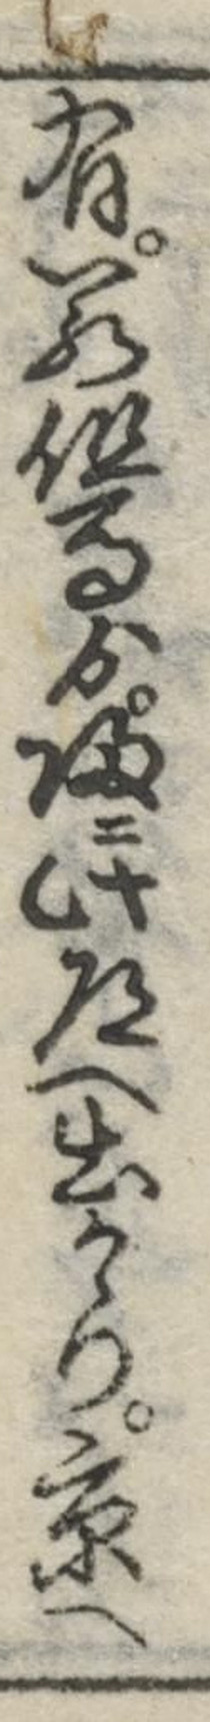有。若但馬ゟ。帰に此道へ出かかり。京へ
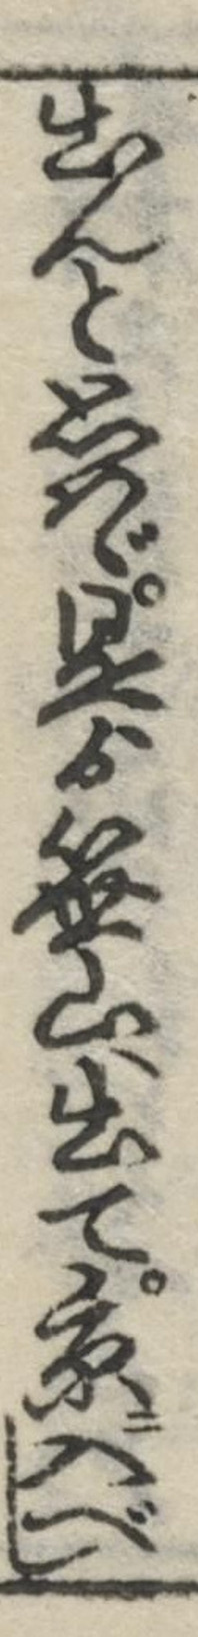出んと思はゞ。是ゟ笹山へ出て。京に入べし
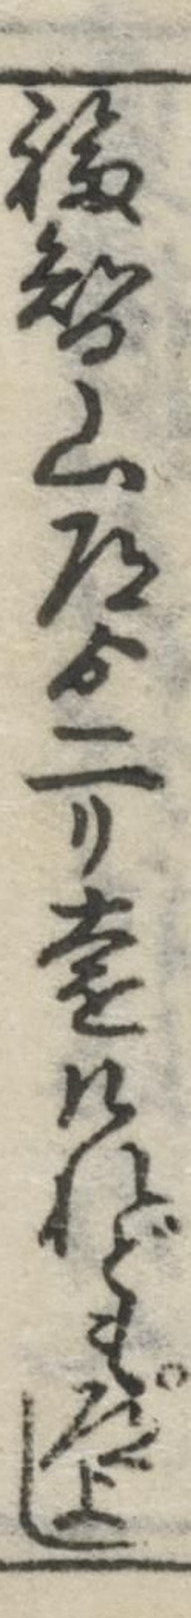福智山道ゟ二り遠けれども。道よし
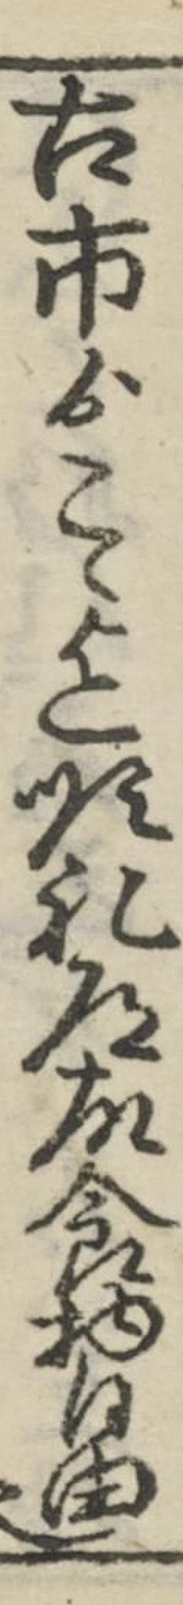古市ゟこゝ迄順礼道故食物自由也
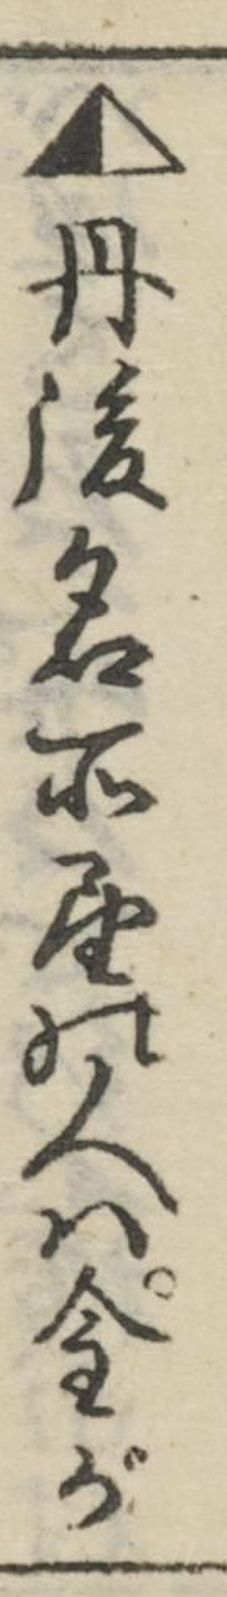▲丹後名所届の人は。金が
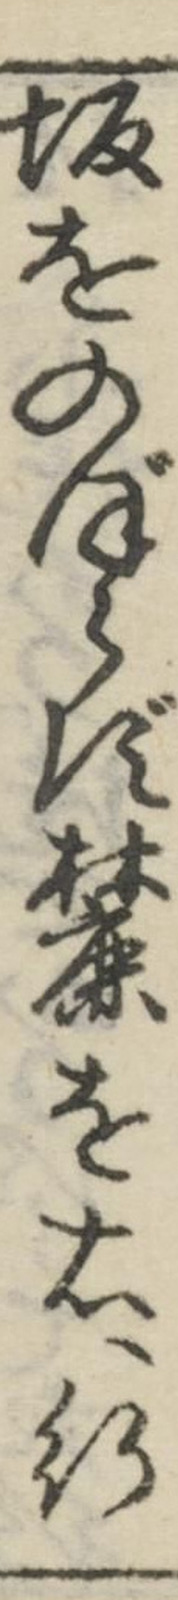坂をのぼらず麓を右へ行
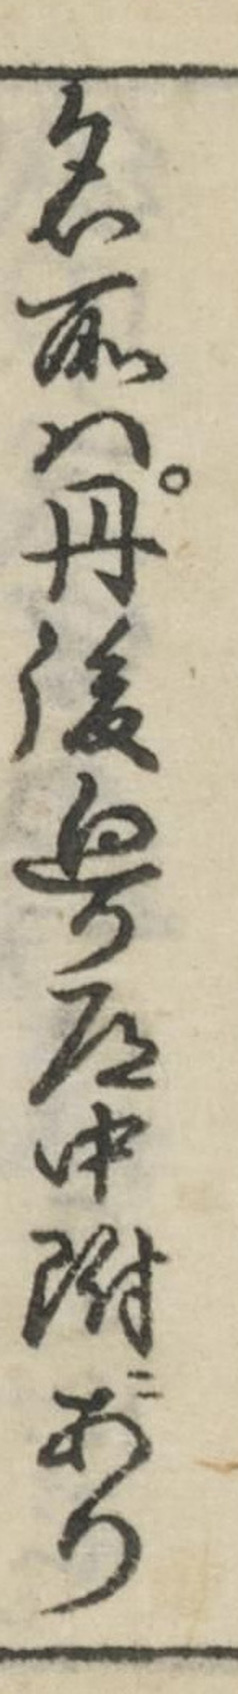名所は。丹後廻り道中附にあり
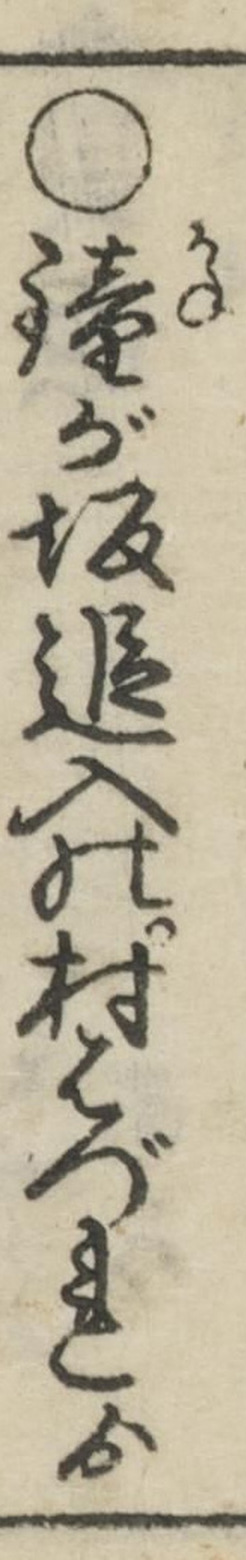○鐘が坂追入の。村はづれゟ
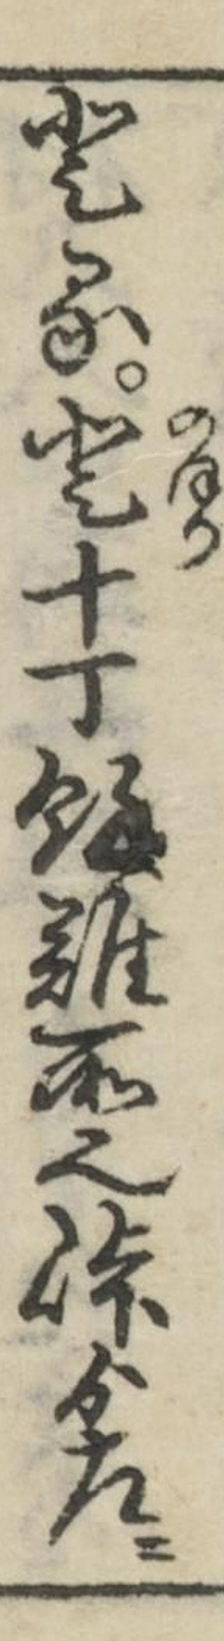登る。登十丁余難所也峠ゟ左に
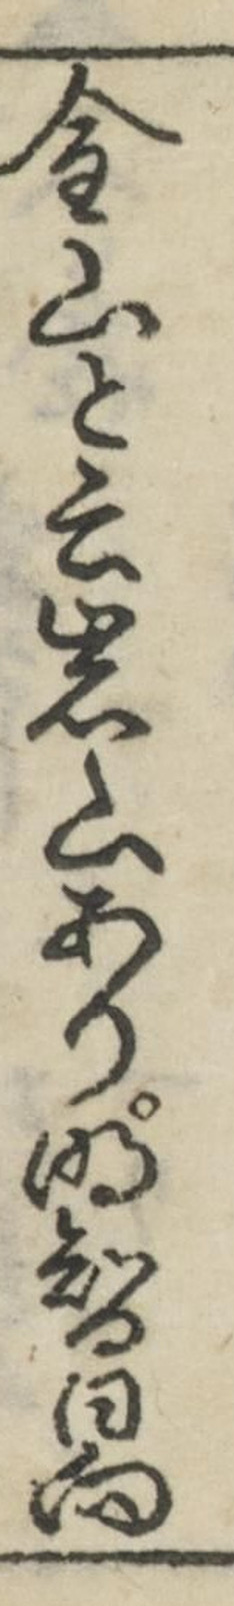金山と云岩山あり。明智日向
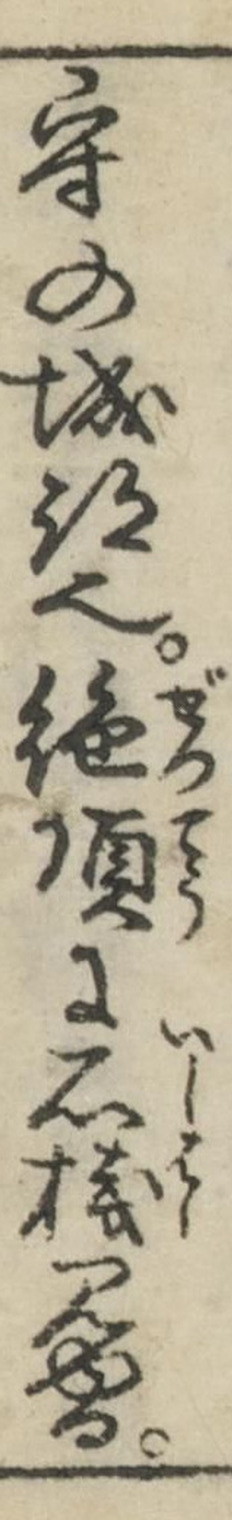守の城跡也。絶頂に石桟見ゆる。

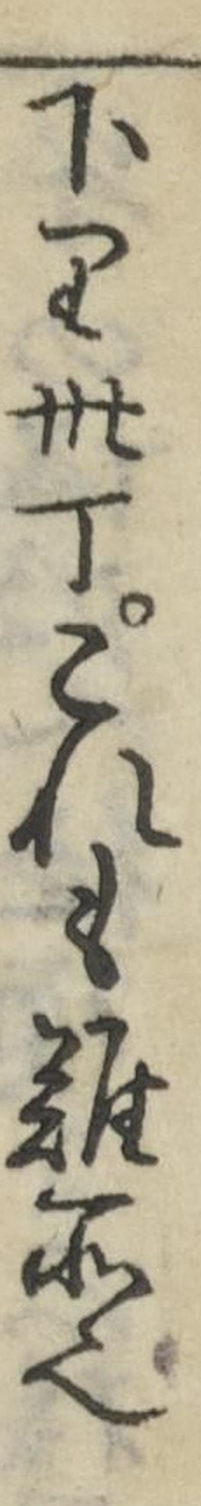下り卅丁。これも難所也
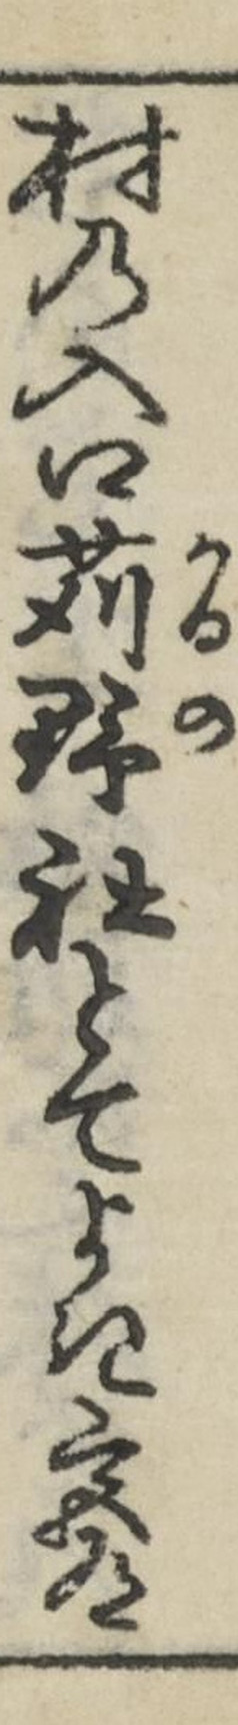村の入口苅野社とてよき宮有
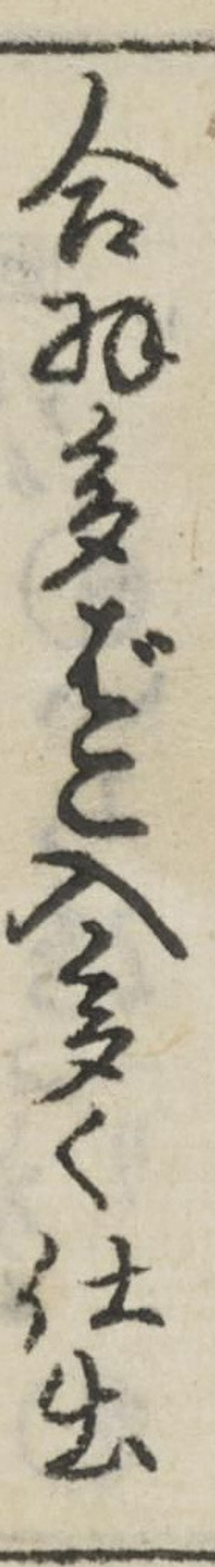合羽たばこ入多く仕出
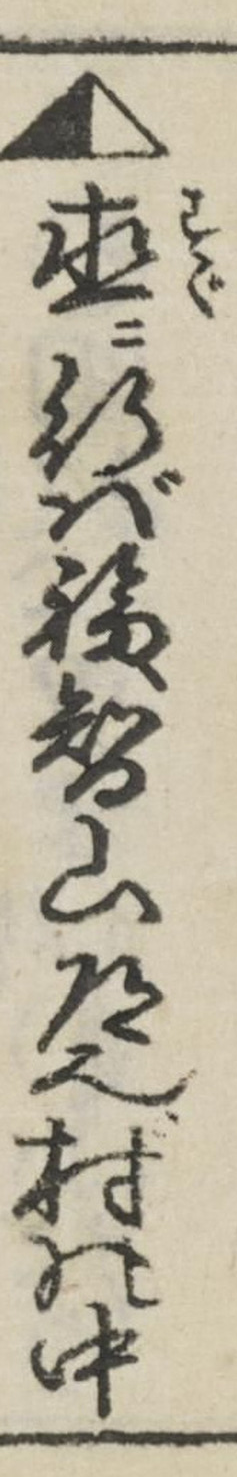▲直に行ば福智山道也村の中
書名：但州城崎浴湯辧
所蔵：東京大学地震研究所図書室 Earthquake Research Institute Library, The University of Tokyo, JAPAN
